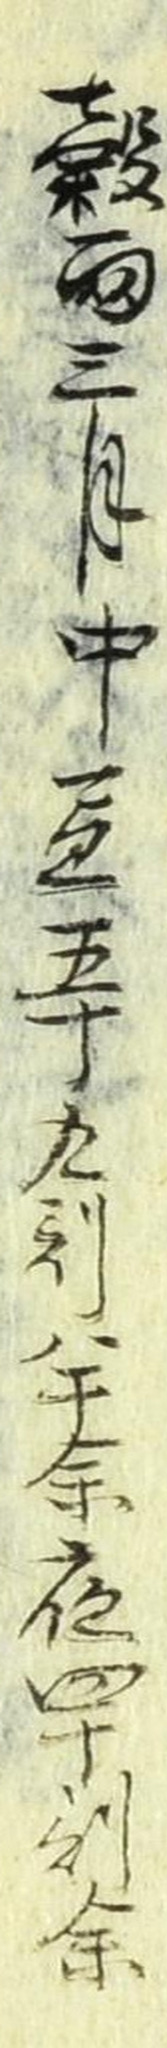穀雨三月中昼五十九刻半余夜四十刻余
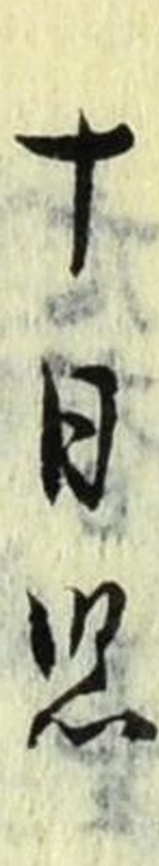四日照
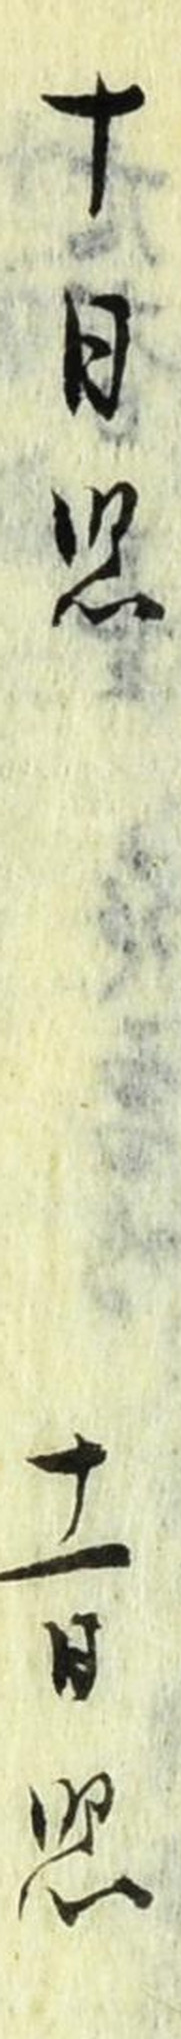十日照十一日照
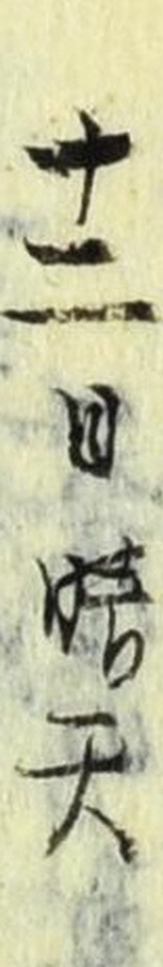十二日晴天
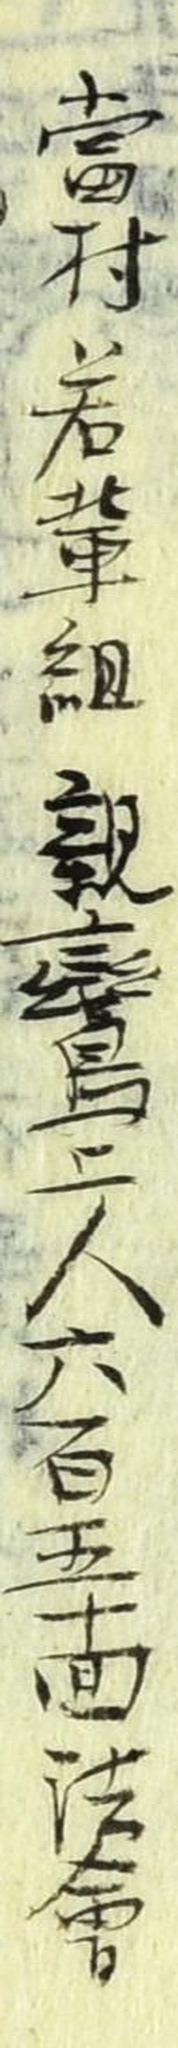当村若輩組親鸞上人六百五十回法会
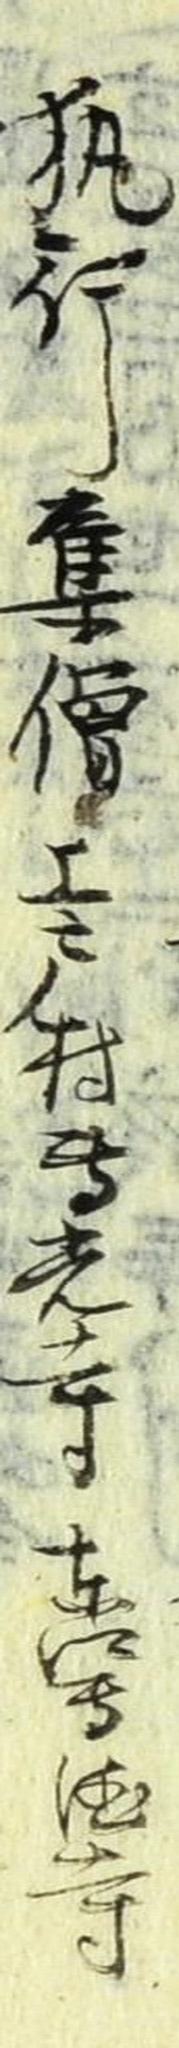執行集僧上戸村専光寺東郷専徳寺
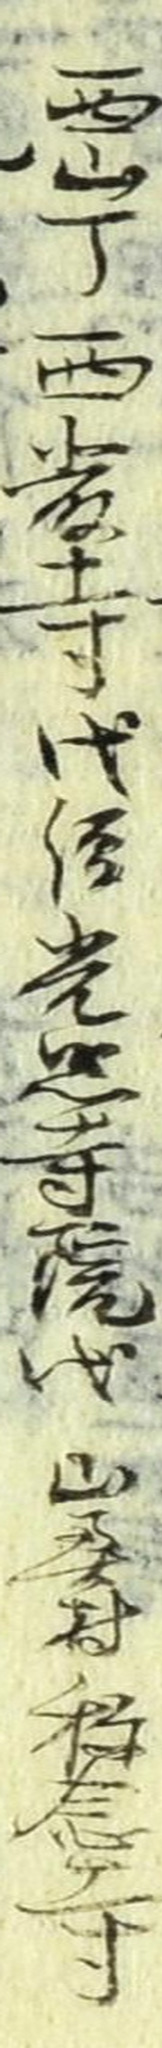西山丁西厳寺代僧光照寺院代山奥村称念寺
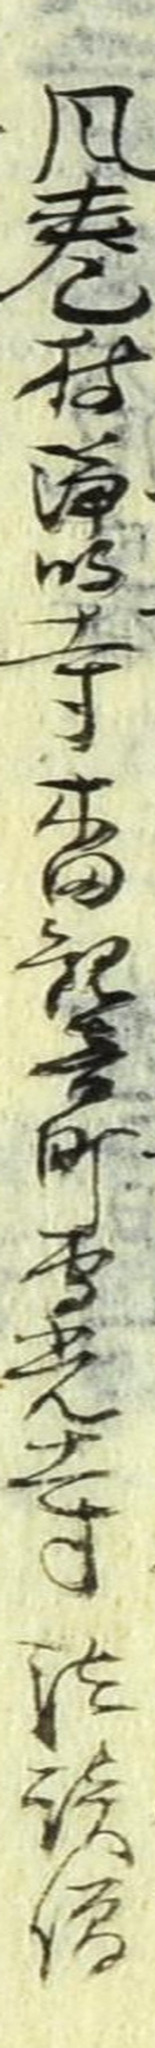風巻村浄明寺木田観音町専光寺法談僧
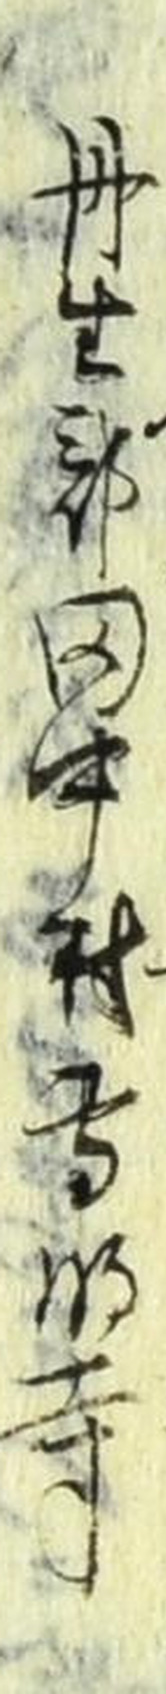丹生郡田中村専明寺
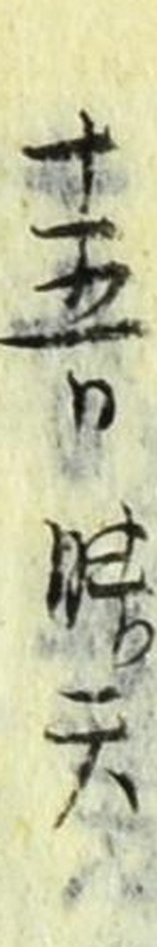十五日晴天
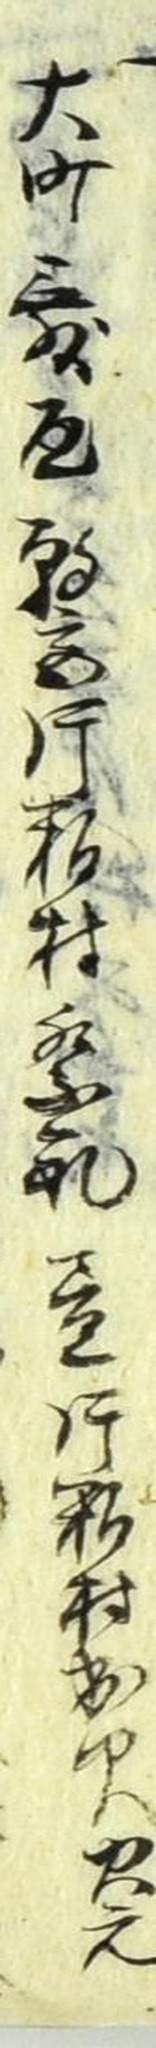大町舞屋朝宮片粕村祭礼昼片粕村出火火元
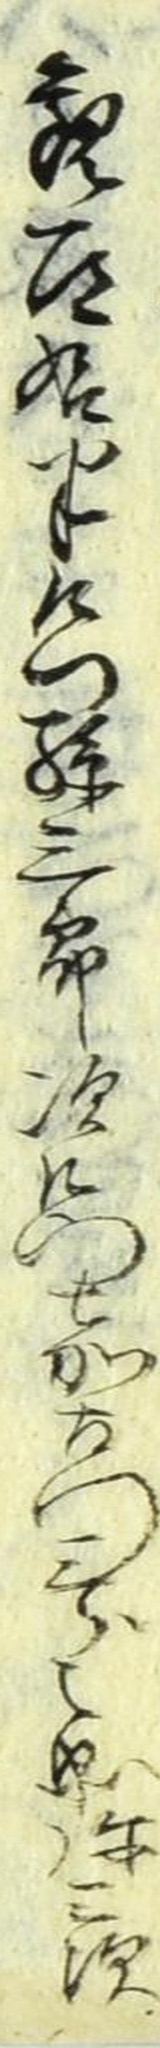観道始半左衛門孫三郎次左衛門嘉左衛門三郎兵衛弥三次
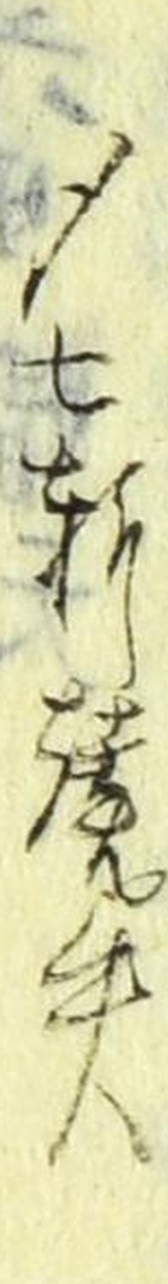〆七軒焼失

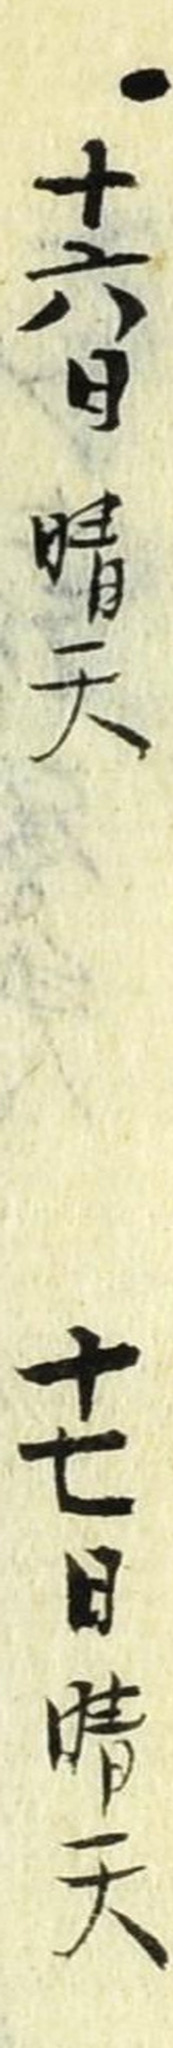十六日晴天十七日晴天
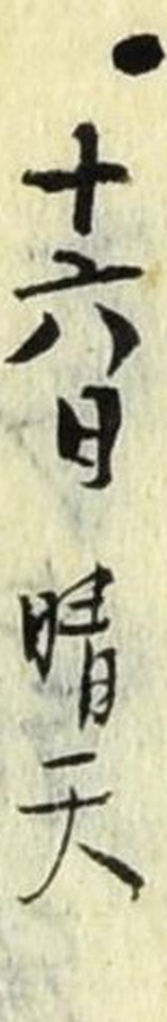十八日雨天
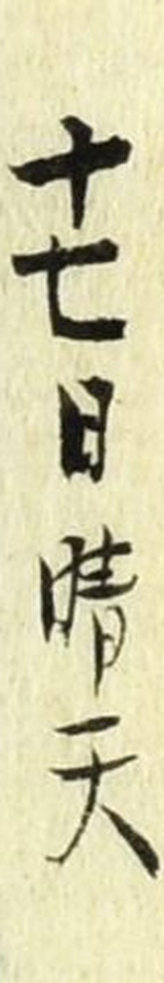十八日雨天
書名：（日記）
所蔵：福井県文書館 Fukui Prefectural Archives
